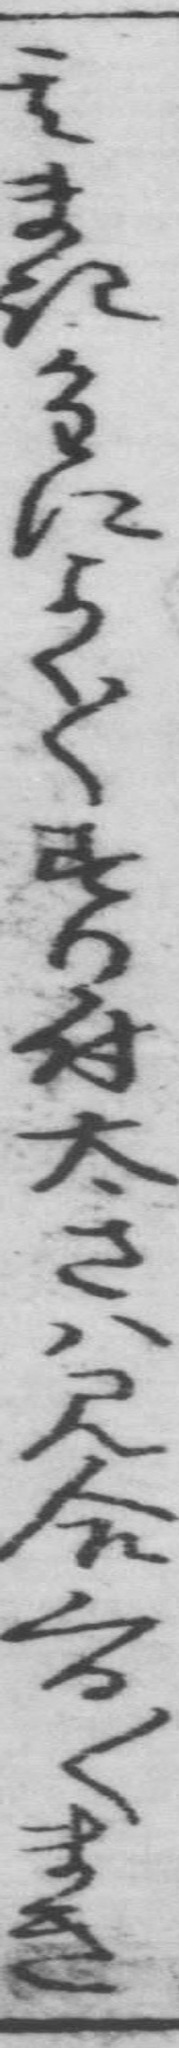其まきかわによく〳〵すり付太さハ見合くる〳〵まき
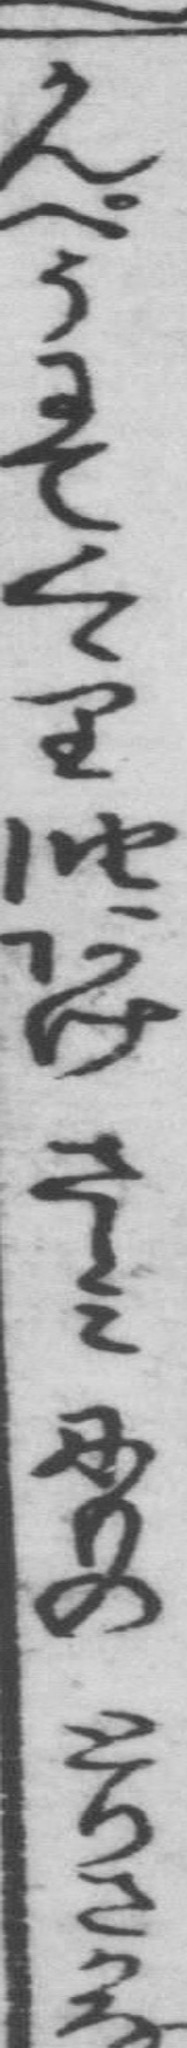かんぺうにてくゝり油あげさしミにものとりさかな
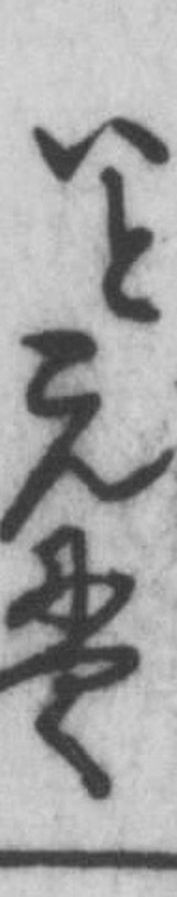えいこんにやく
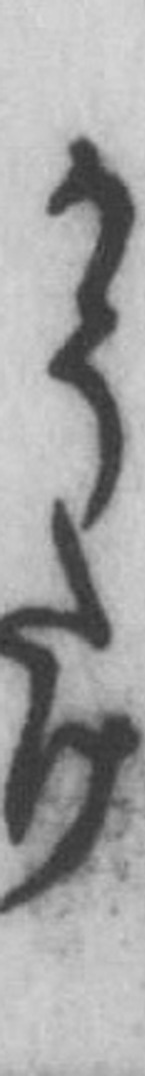かうたけ
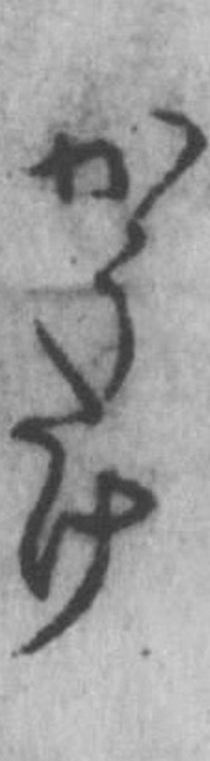かうたけ
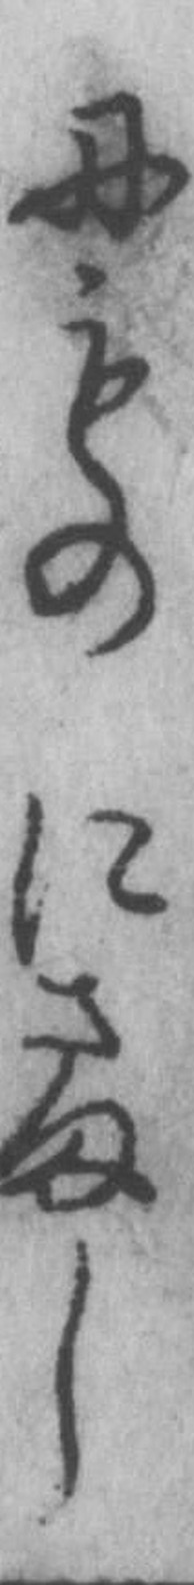にものにさまし
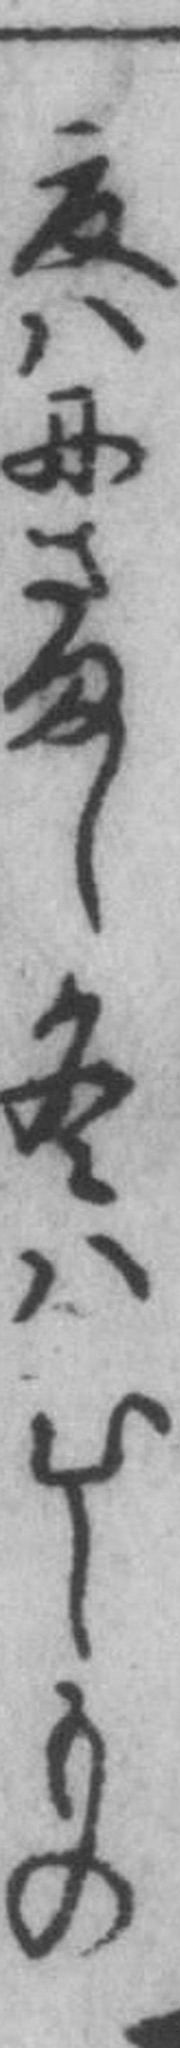ハにさましハむしもの
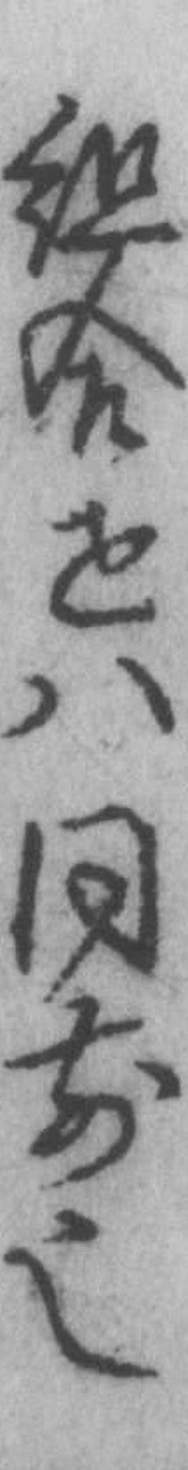組合をハ同前也
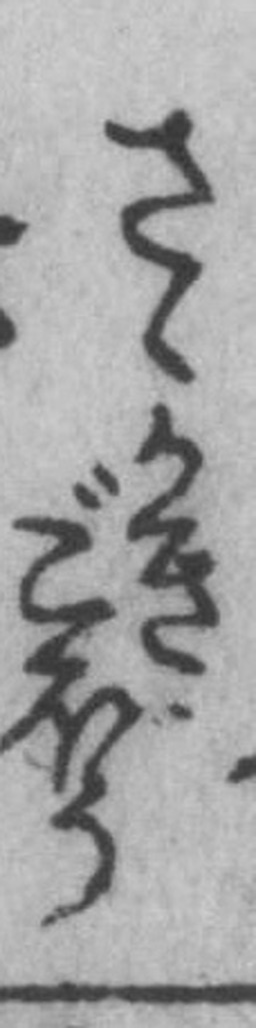ごほう
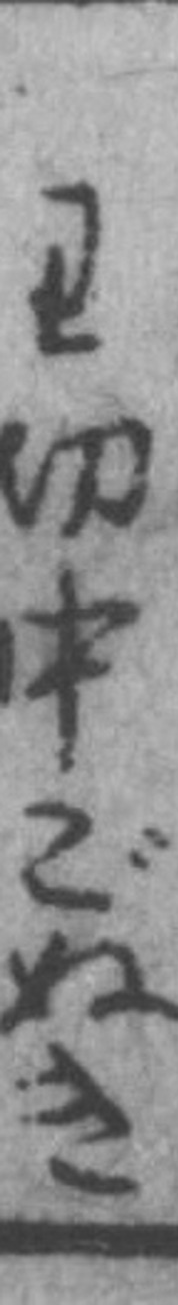生ふわ切中ごぬき
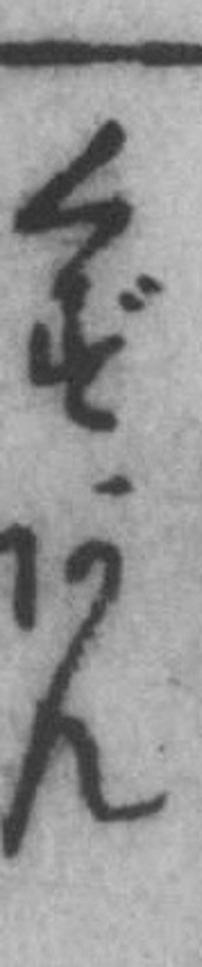くずあん

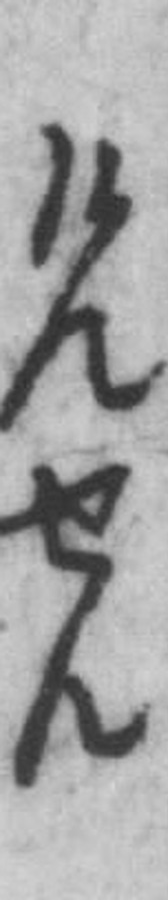けんせん
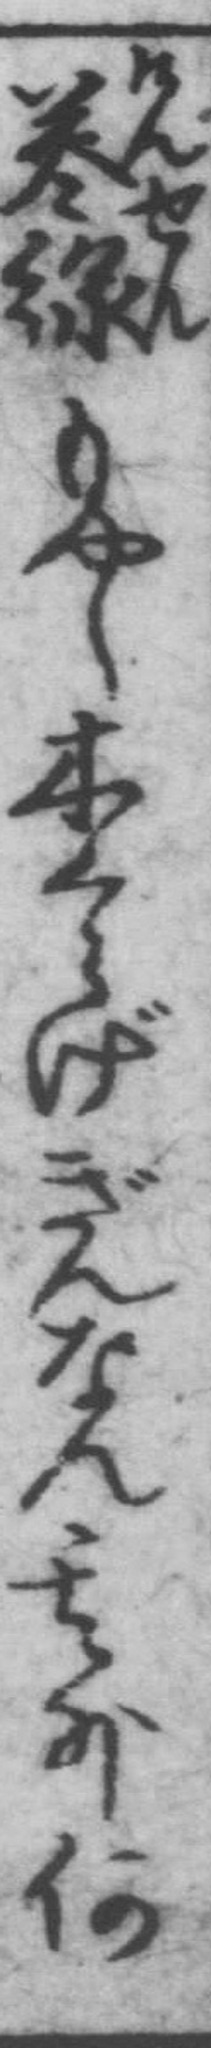巻線もやし木くらげぎんなん其外何
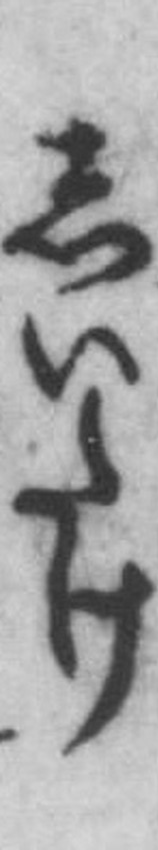しいたけ
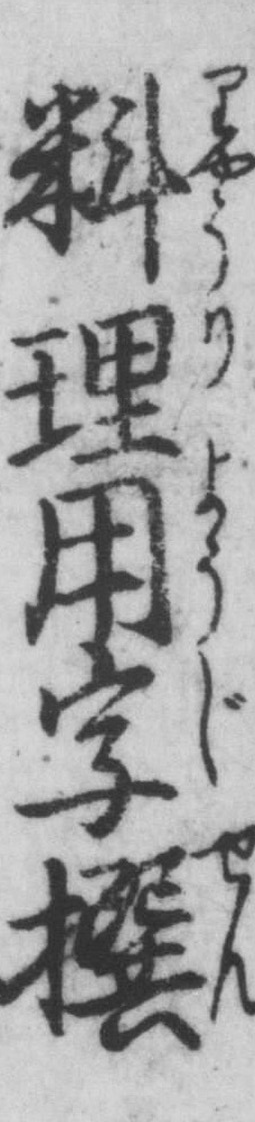料理用字撰
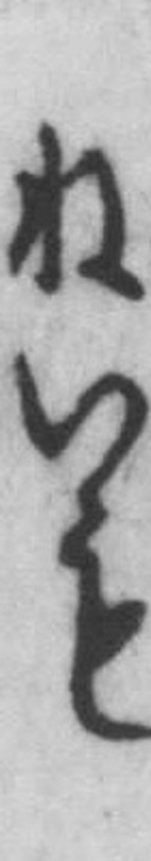ねいも
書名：料理献立抄
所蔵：大阪府立大学学術情報センター 国文学研究資料館
